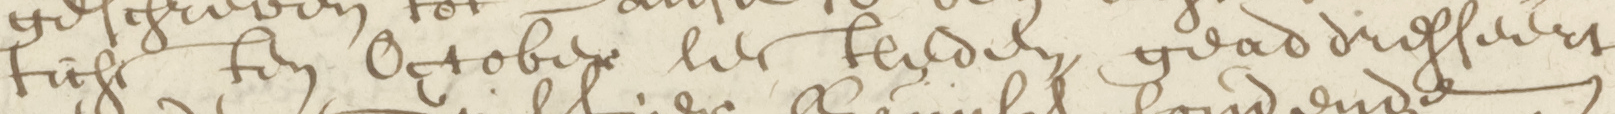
tichsten October lestleden, geaddresseert
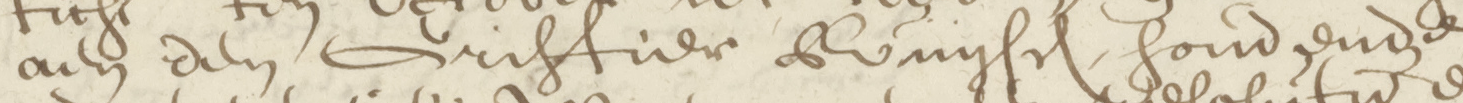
aen den Griffier Ruijsch, houdende
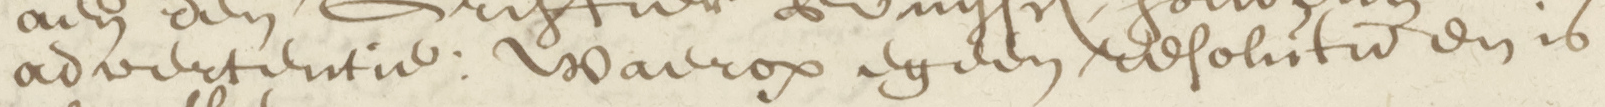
advertentie: Waerop egeen resolutie en is
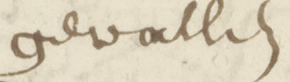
gevallen.
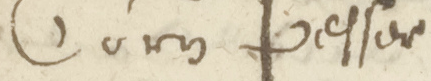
Corn. Pesser
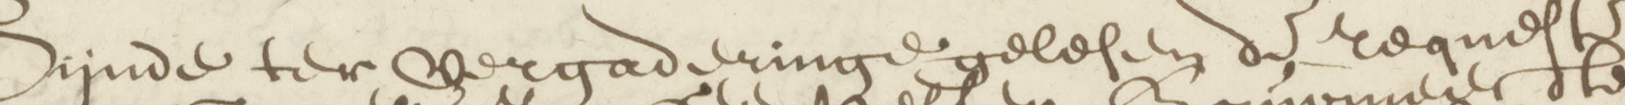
Sijnde ter Vergaderinge gelesen de requeste
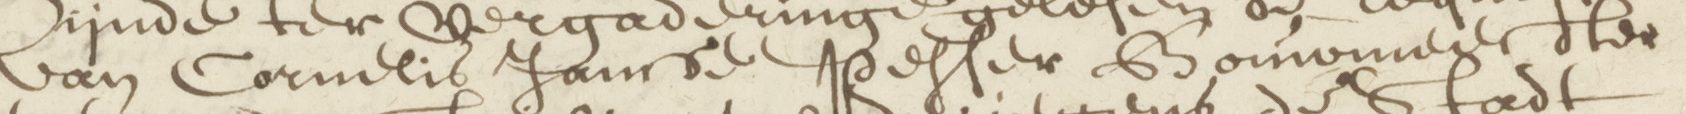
van Cornelis Jansse Pesser Bouwmeester
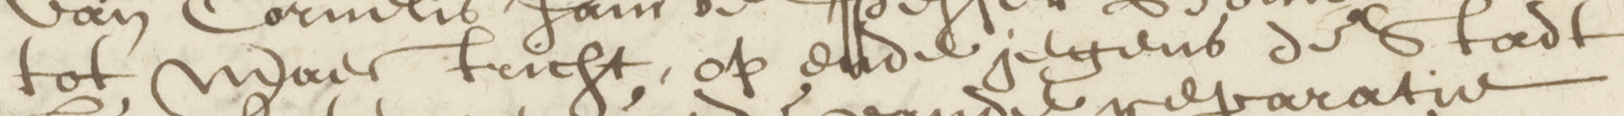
tot Maestricht, op ende jegens de Stadt
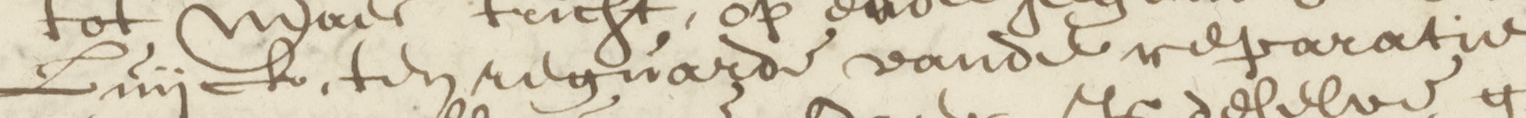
Luijck, ten reguarde vande reparatie
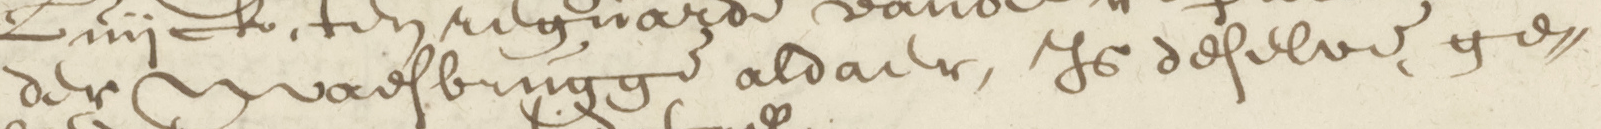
der Maesbrugge aldaer, Is deselve ge„
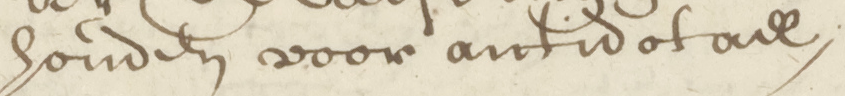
houden voor antidotael.
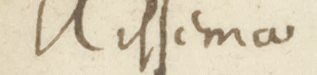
Aissema
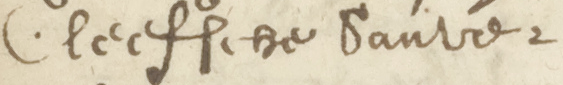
Cleefsche Sauve„
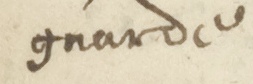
guarde
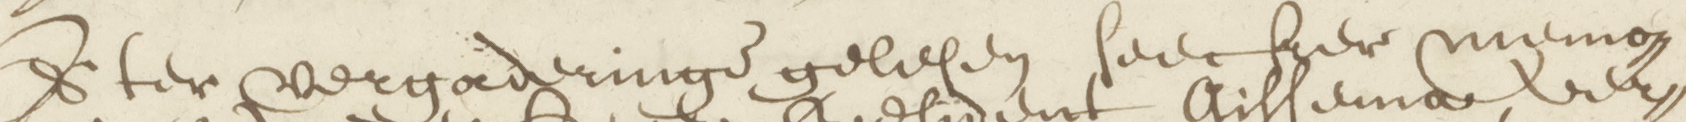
Is ter Vergaderinge gelesen seecker memo„
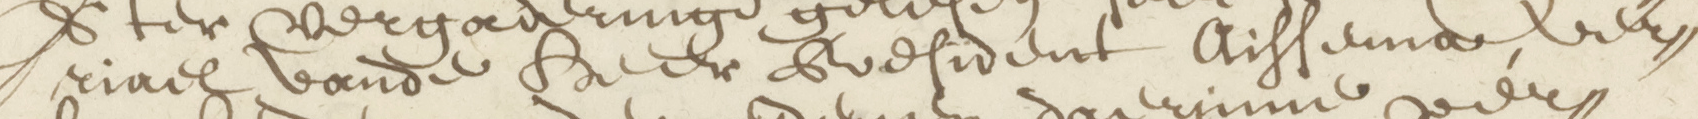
riael vande Heer Resident Aissema, ver„
